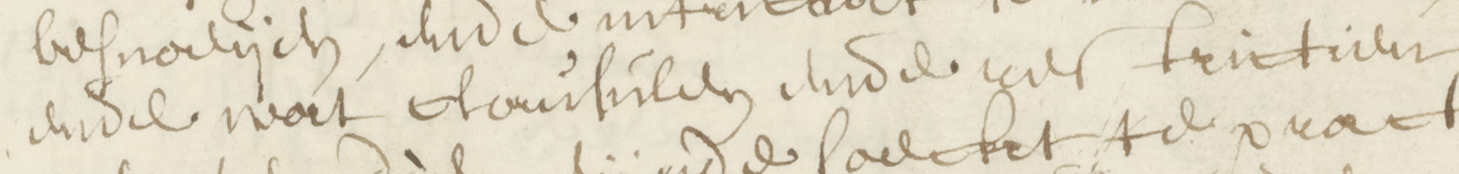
ende wat clousulen ende restrictien
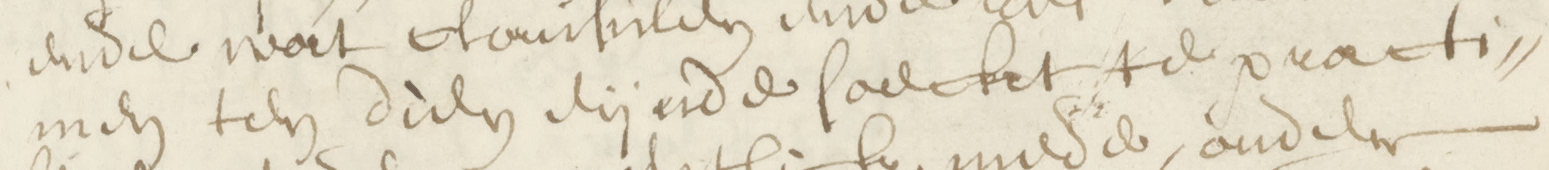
men ten dien eijnde soeckt te practi„
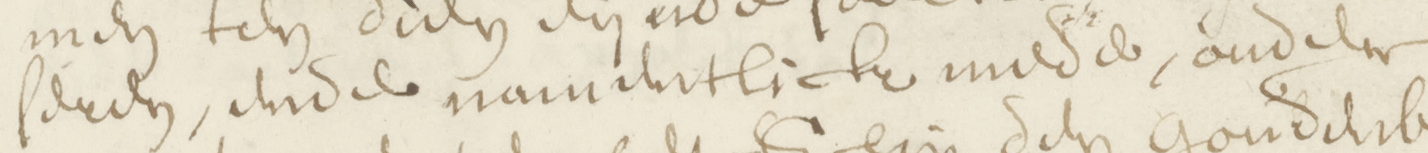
seren, ende namentlick mede, onder
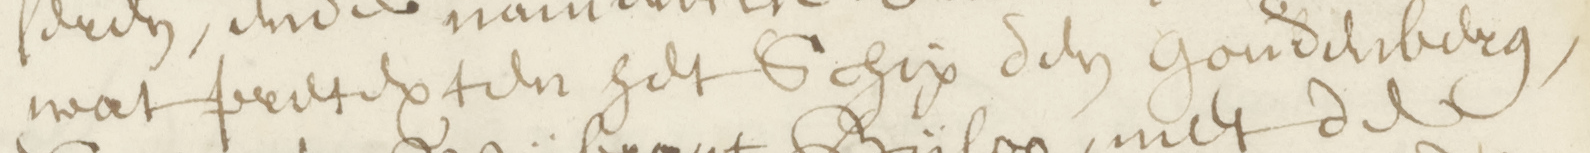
wat pretexten het Schip den Goudenberg
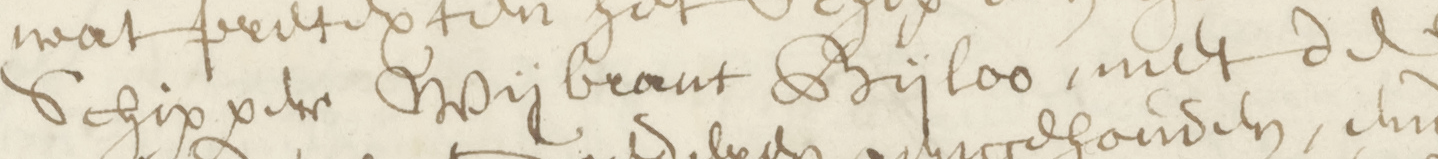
Schipper Wijbrant Bijloo, met de
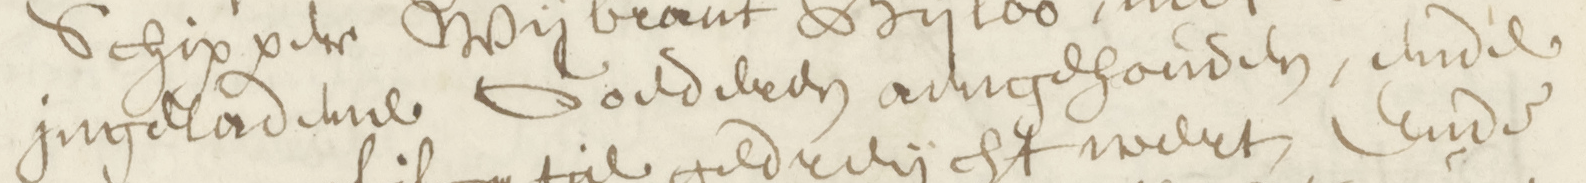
ingeladene goederen aengehouden, ende
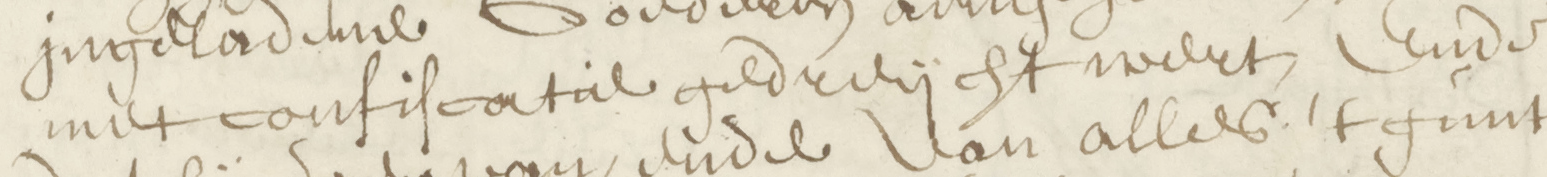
met confiscatie gedreijcht wert, ende
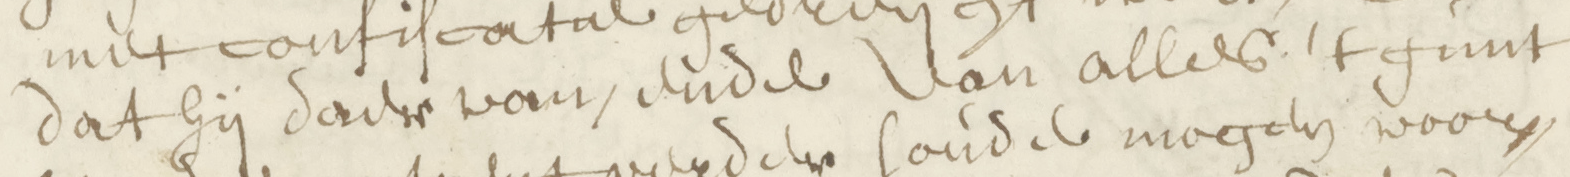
dat hij daer van, ende van alles 't gunt
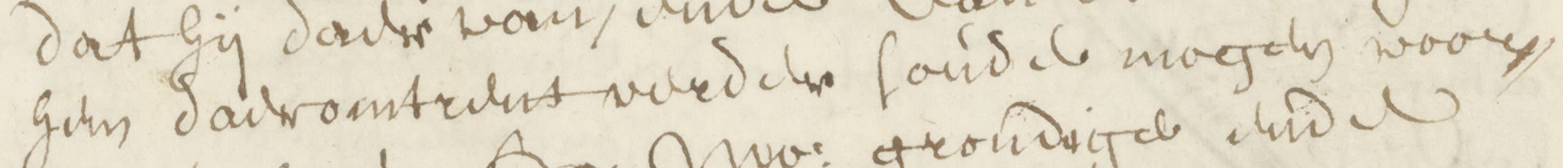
hem daeromtrent verder soude mogen voor„
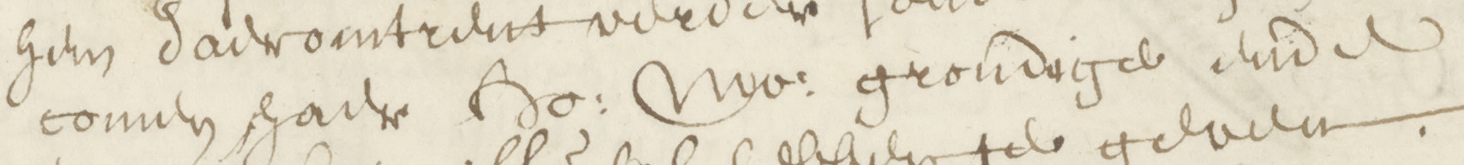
comen haer Ho:Mo: grondige ende
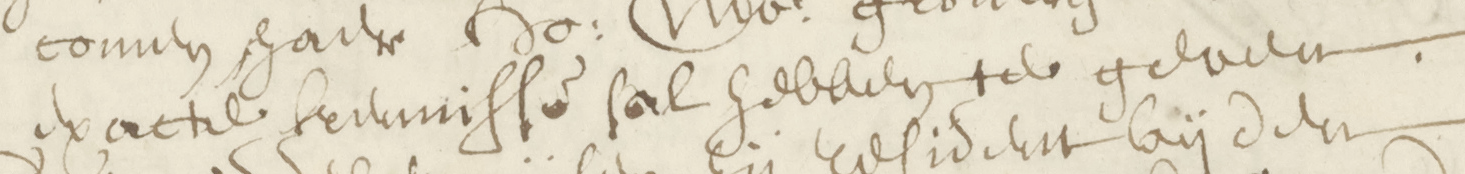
exacte kennisse sal hebben te geven.
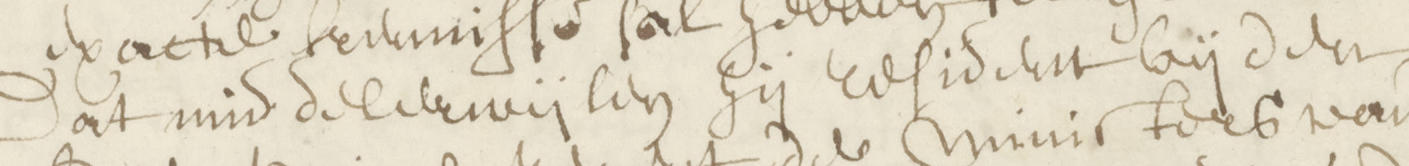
Dat middelerwijlen hij resident bij den
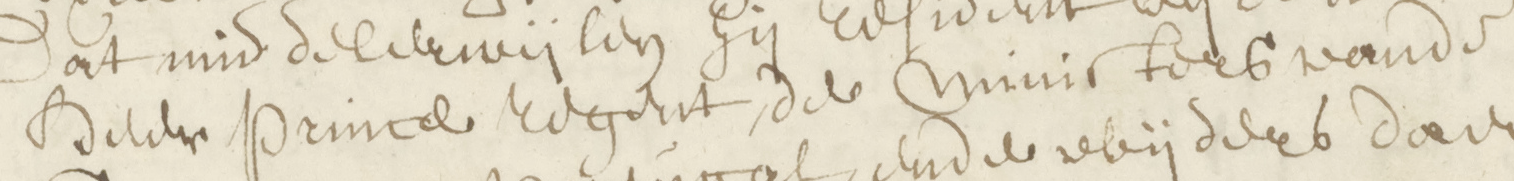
Heer Prince regent, de Ministers vande
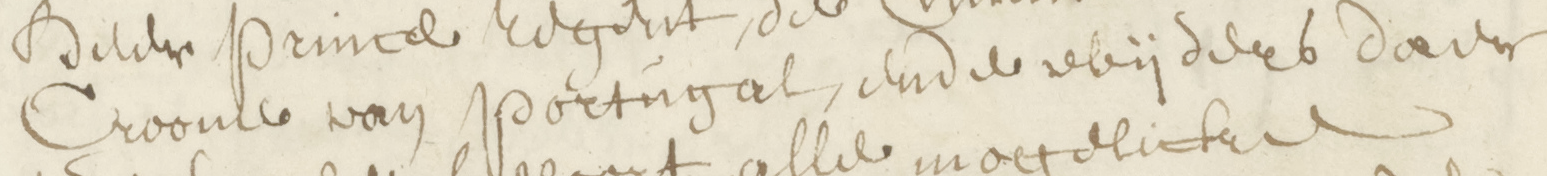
Croone van Portugal, ende wijders daer
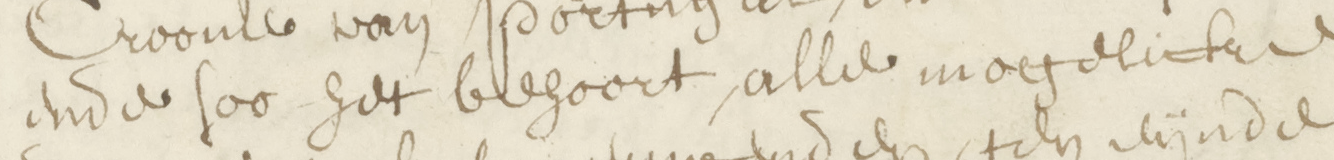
ende soo het behoort, alle mogelicke
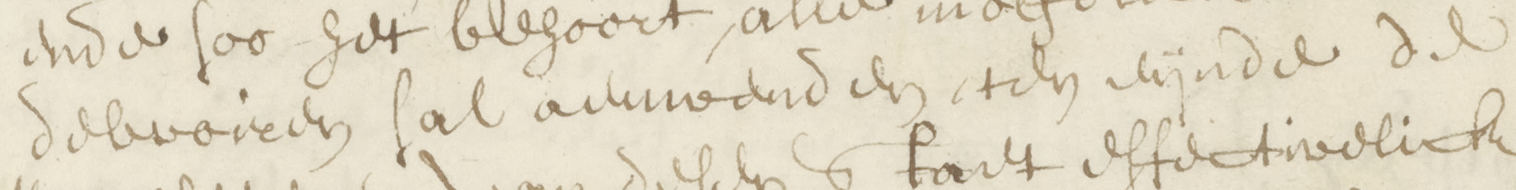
debvoiren sal aenwenden, ten eijnde de
